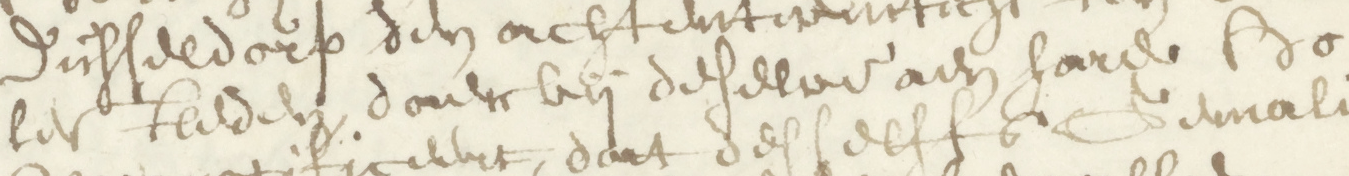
lestleden, daerbij deselve aen hare Ho:
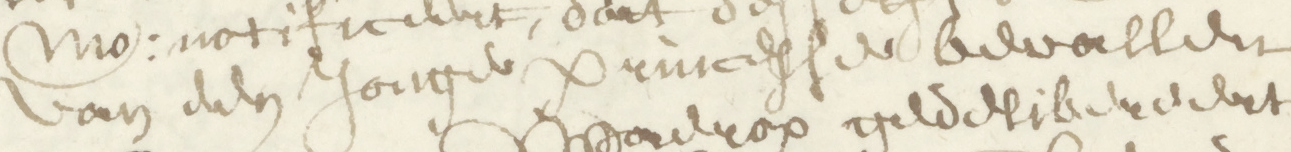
van een Jonge Princesse bevallen
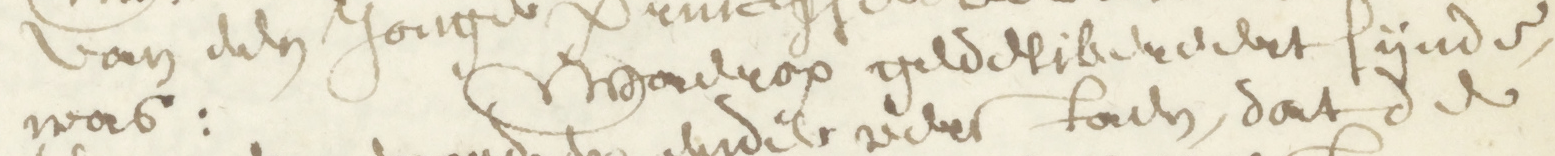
was: Waerop gedelibereert sijnde,
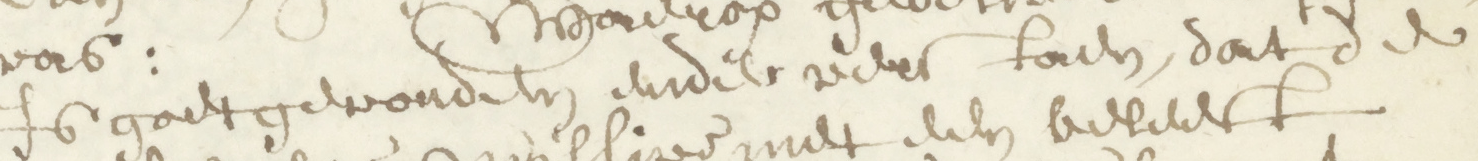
Is goetgevonden ende verstaen, dat de
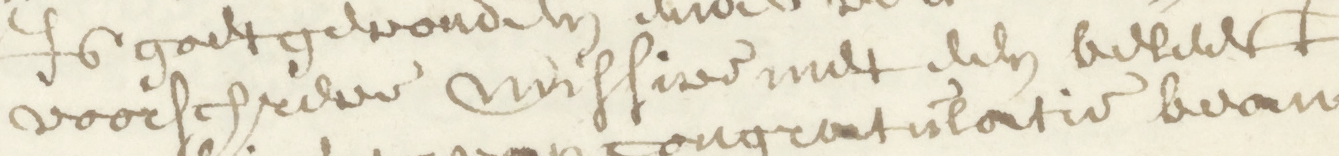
voorschreve missive met een beleeft
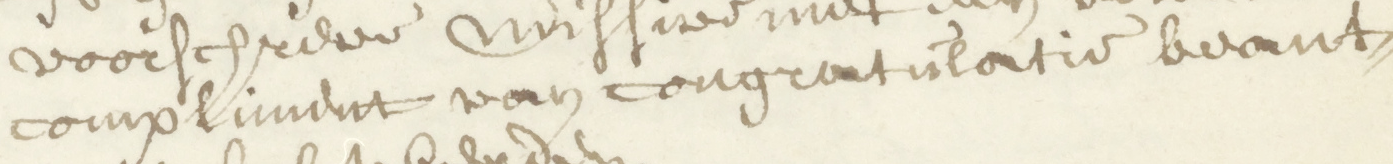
compliment van congratulatie beant„
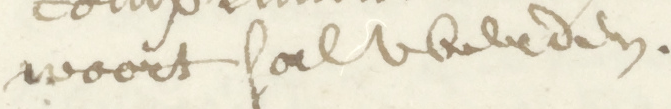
woort sal werden.
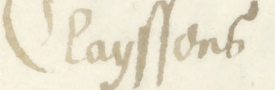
Clayssens
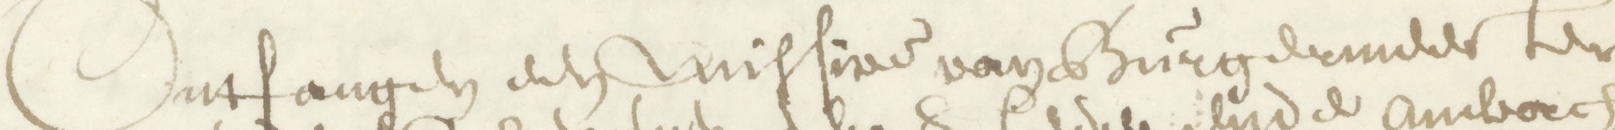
Ontfangen een missive van Burgermeester
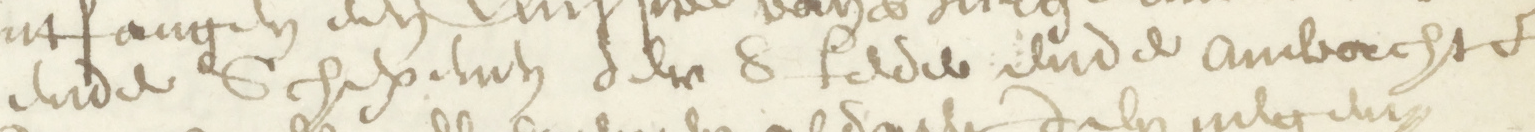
ende Schepenen der Stede ende Ambachte
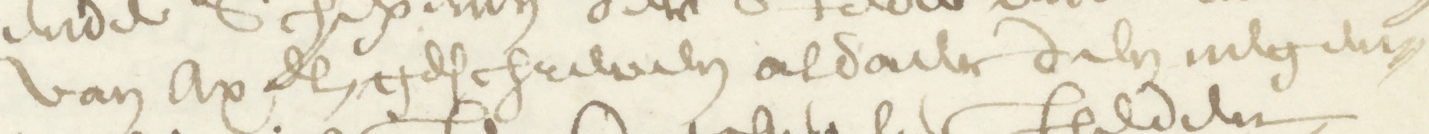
van Axel, geschreven aldaer den negen„
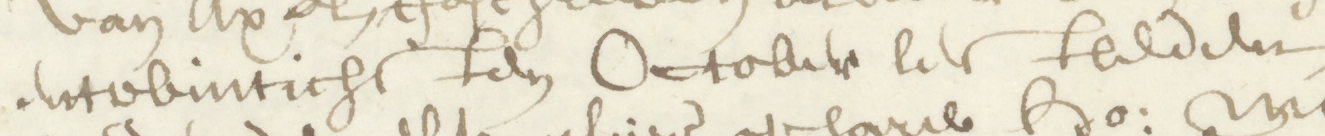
entwintichsten October lestleden,
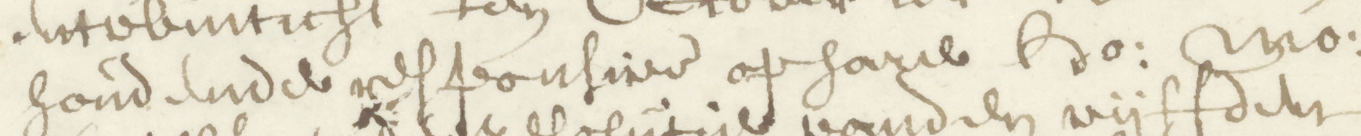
houdende responsive op hare Ho:Mo:
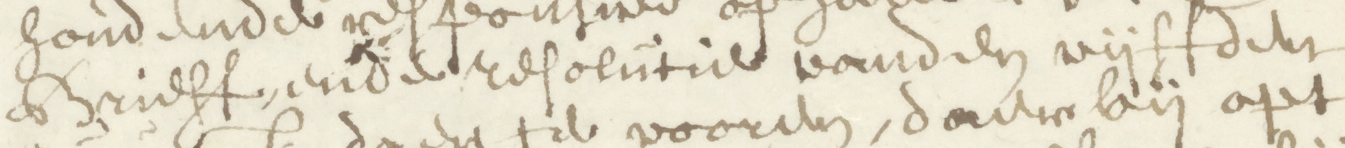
Brieff, ende resolutie vanden vijffden
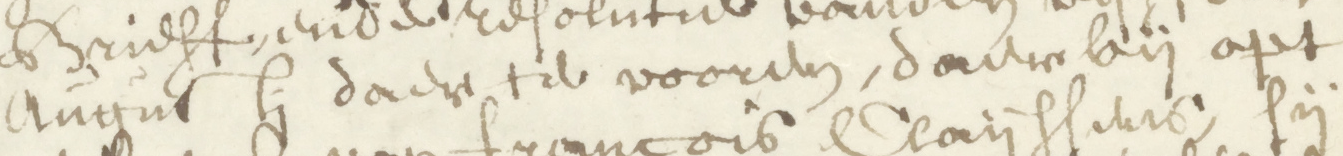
Augusti daer te vooren, daerbij opt
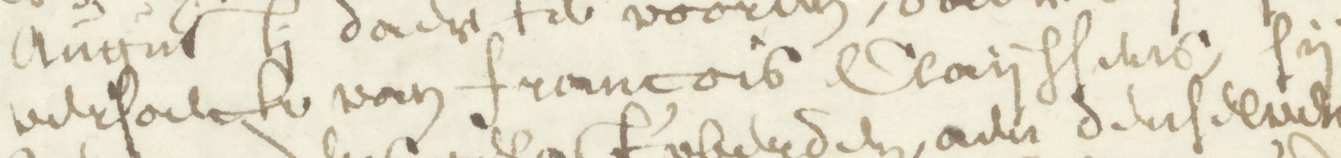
versoeck van francois Claijssens, sij
